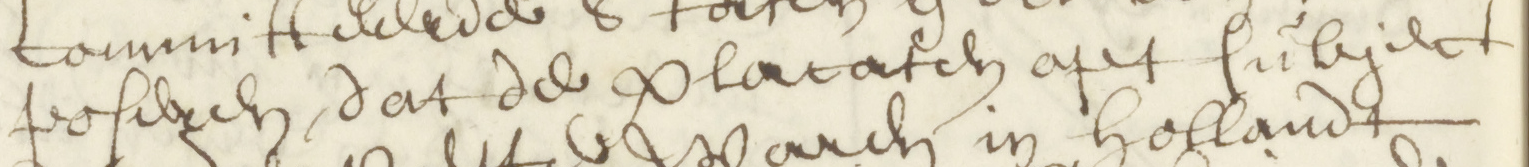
poseren, dat de placaten opt subject
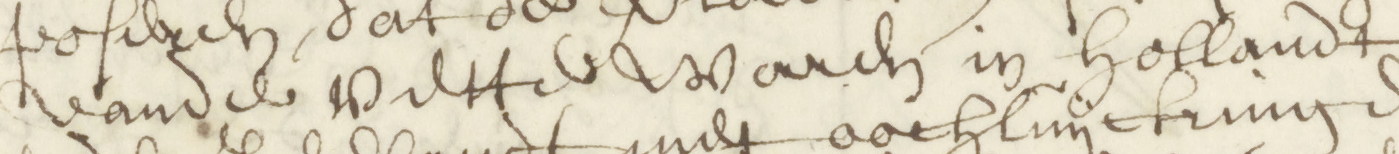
vande Vette Waren in Hollandt
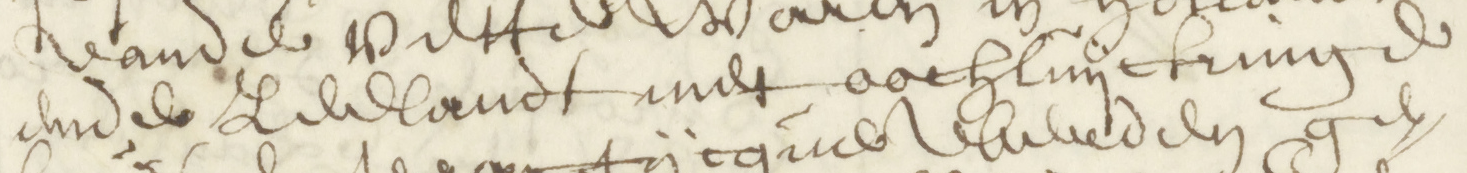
ende Zeelandt met oochluijckinge
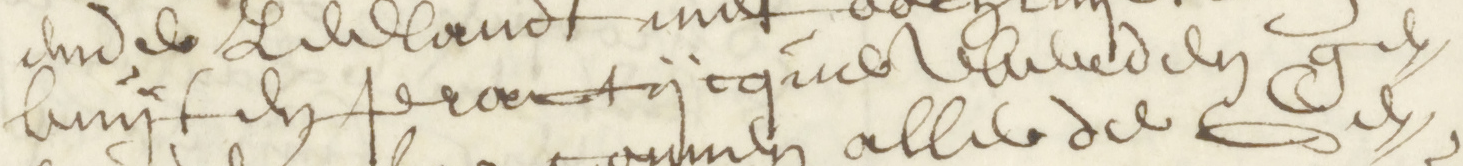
buijten practijcque werden ge,,
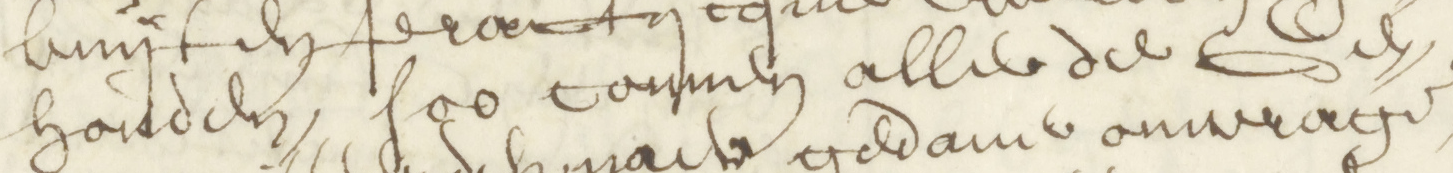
houden, soo connen alle de Ge,,
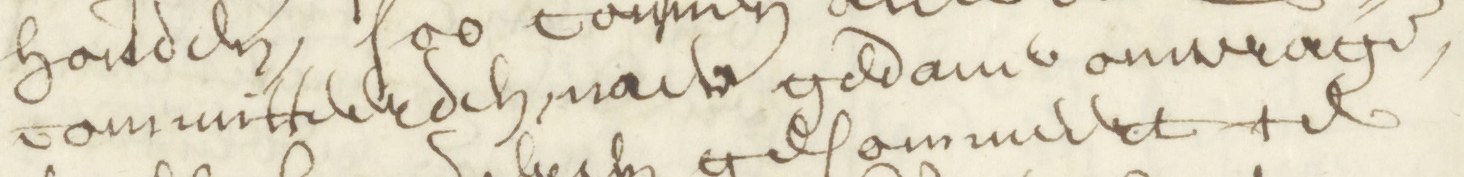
committeerden, naer gedane omvrage,
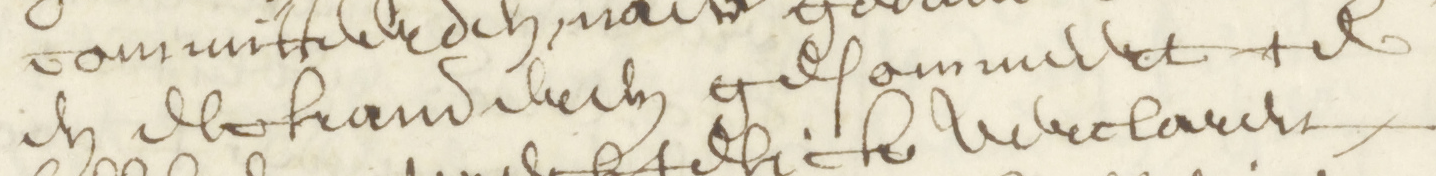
en elckanderen gesommeert te
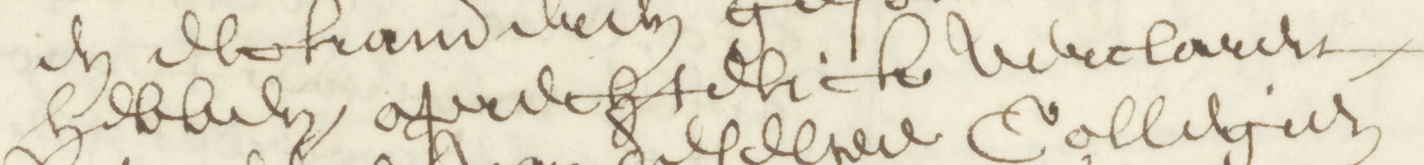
hebben, oprechtelick verclaren,
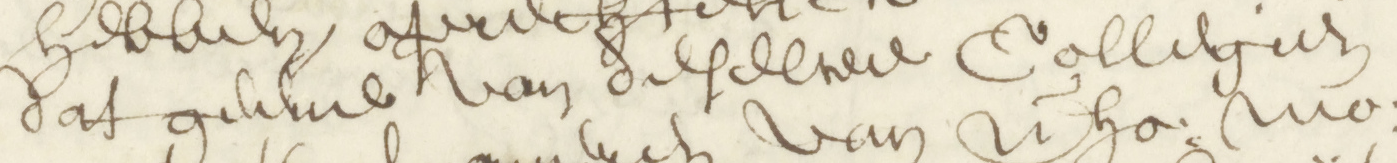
dat geene van deselve Collegien
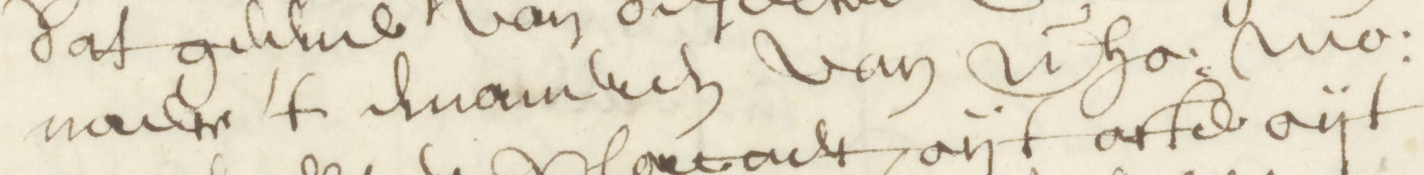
naer 't emaneren van U ho:Mo:
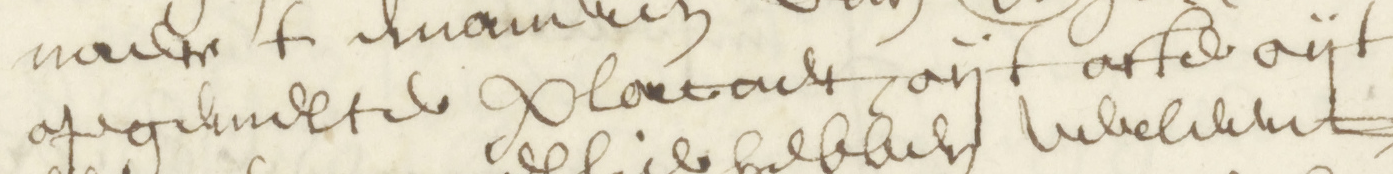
opgemelte Placaet, oijt ofte oijt
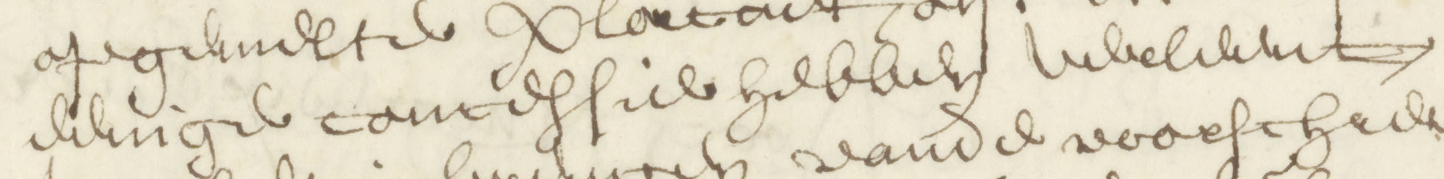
eenige concessie hebben verleent,
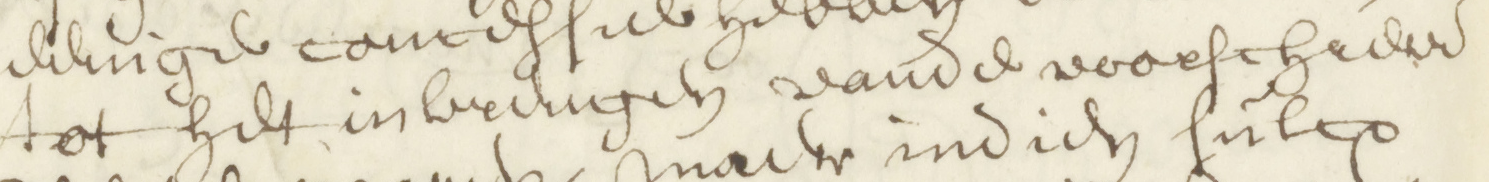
tot het inbrengen vande voorschreve
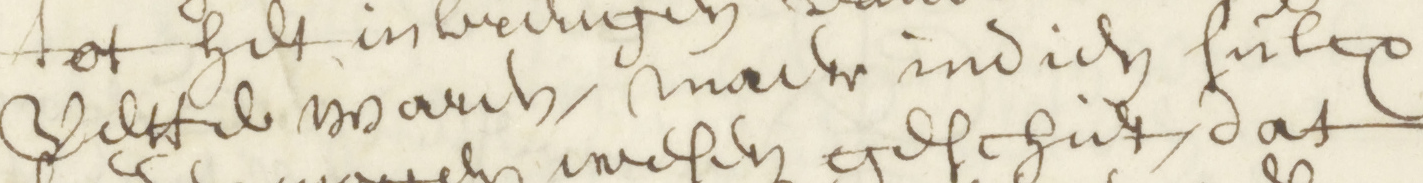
Vette waren, maer indien sulcx
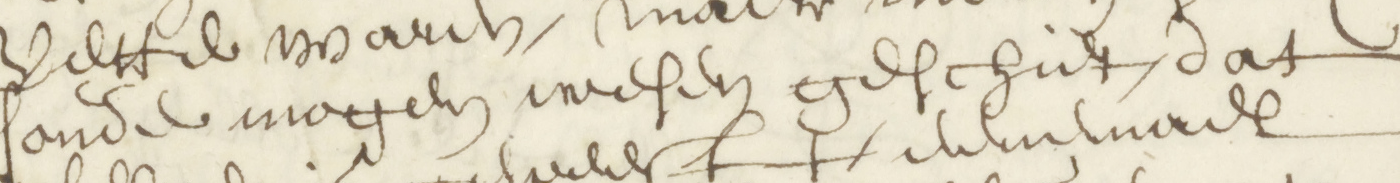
soude mogen wesen geschiet, dat
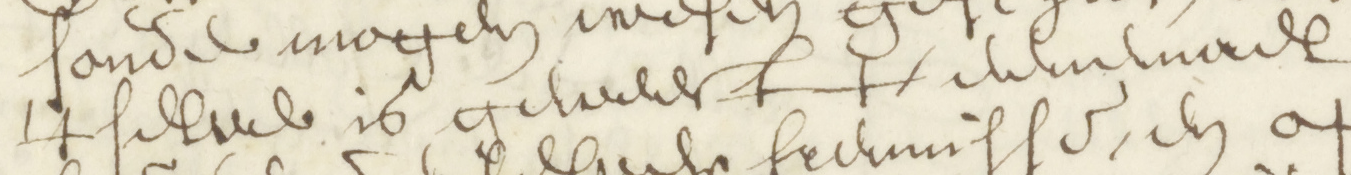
't selve is geweest t' eenemael
